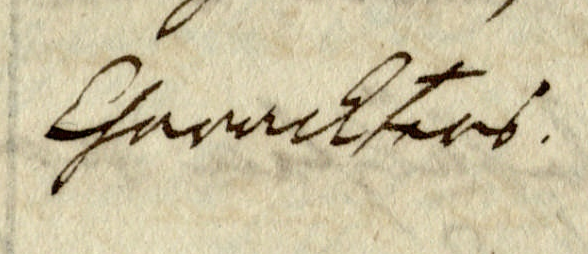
Charackters.
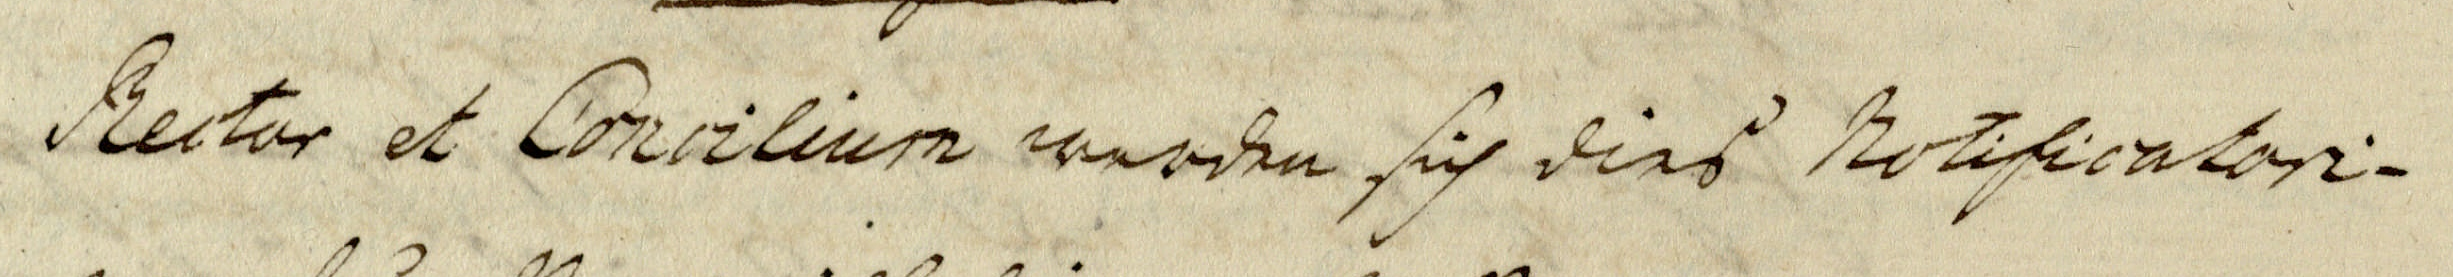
Rector et Concilium werden sich dies Noificatori¬
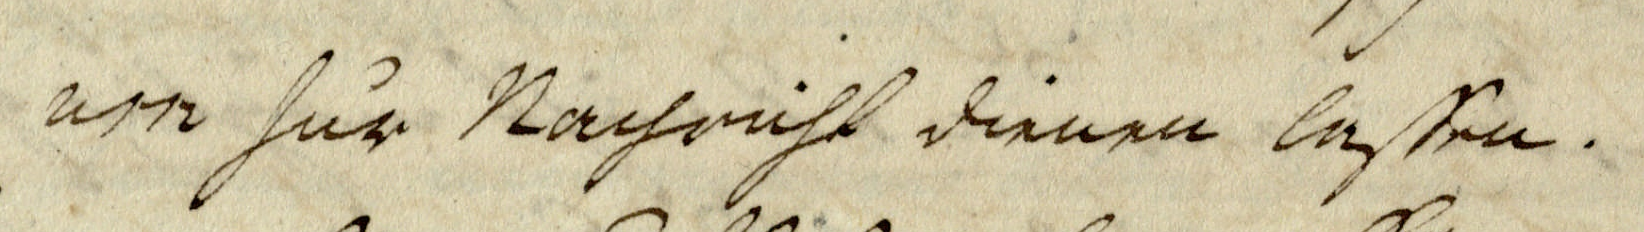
um zur Nachricht dienen lassen.
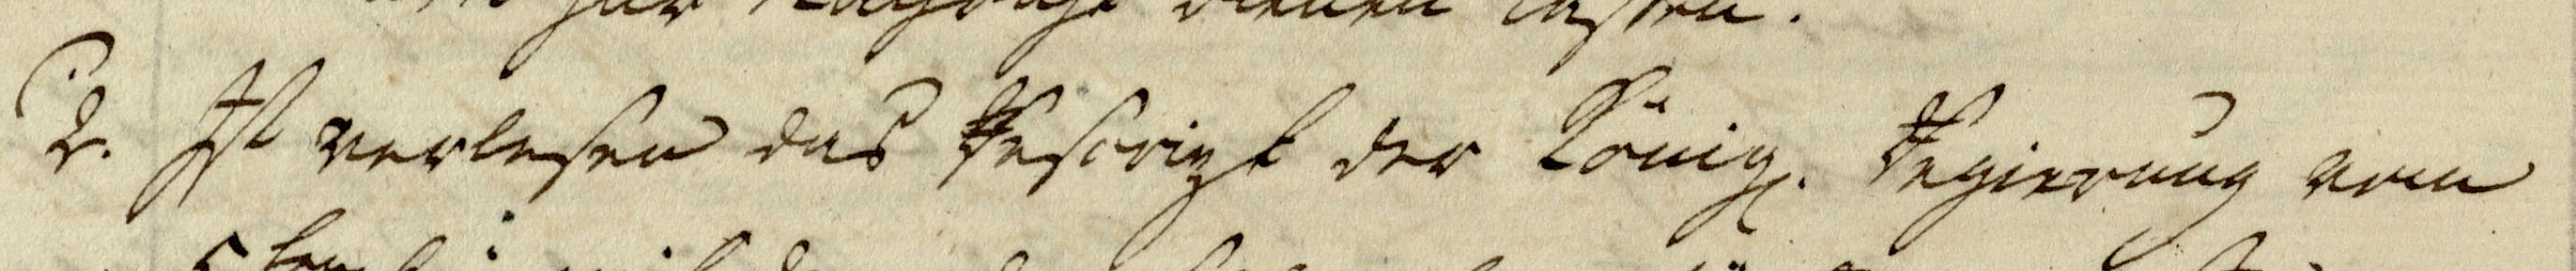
2. Ist verlesen das Rescript der Königl. Regierung vom
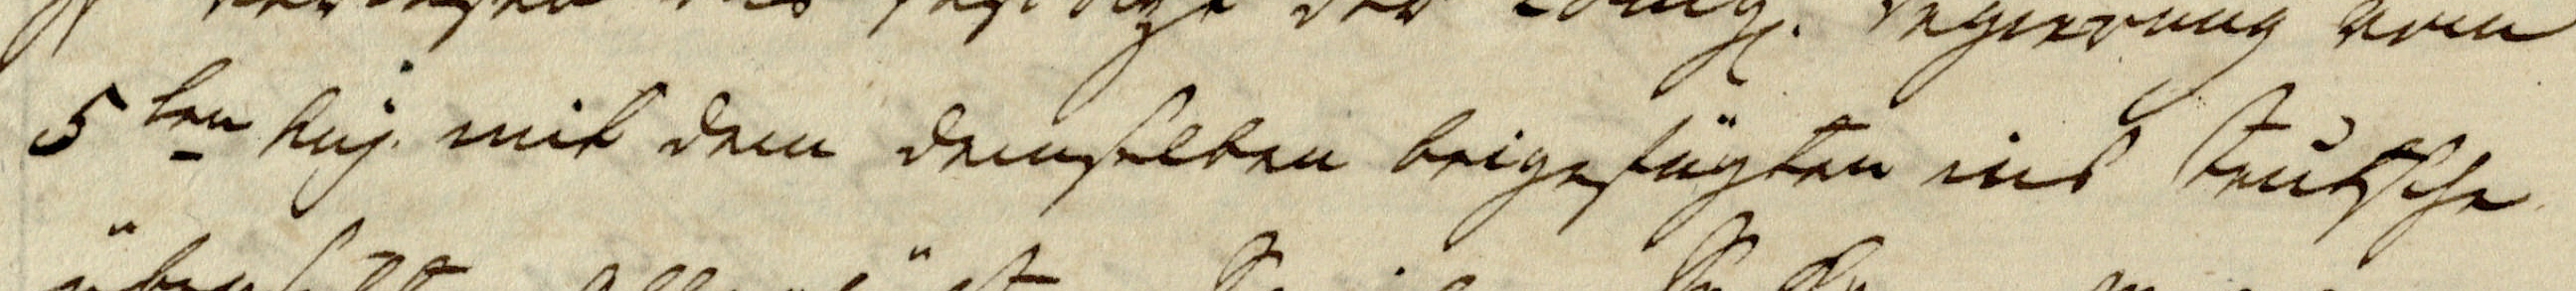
5 ten huj. mit dem demselben beigefügten ins Teutsche
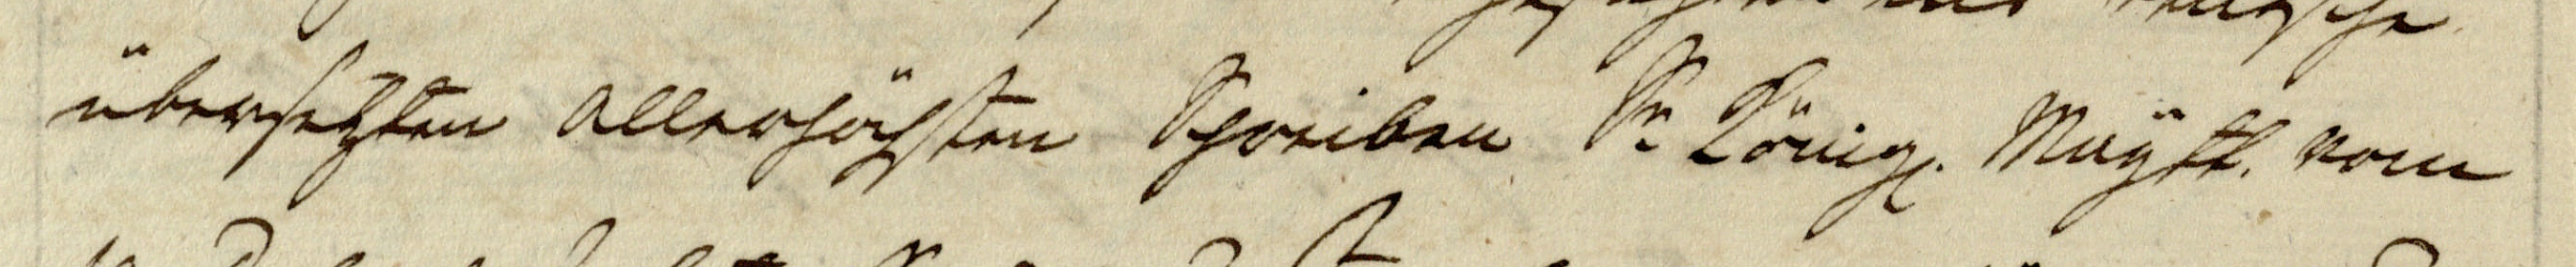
übersetzten Allerhöchsten Schreiben Sr Königl. Maÿtt. vom
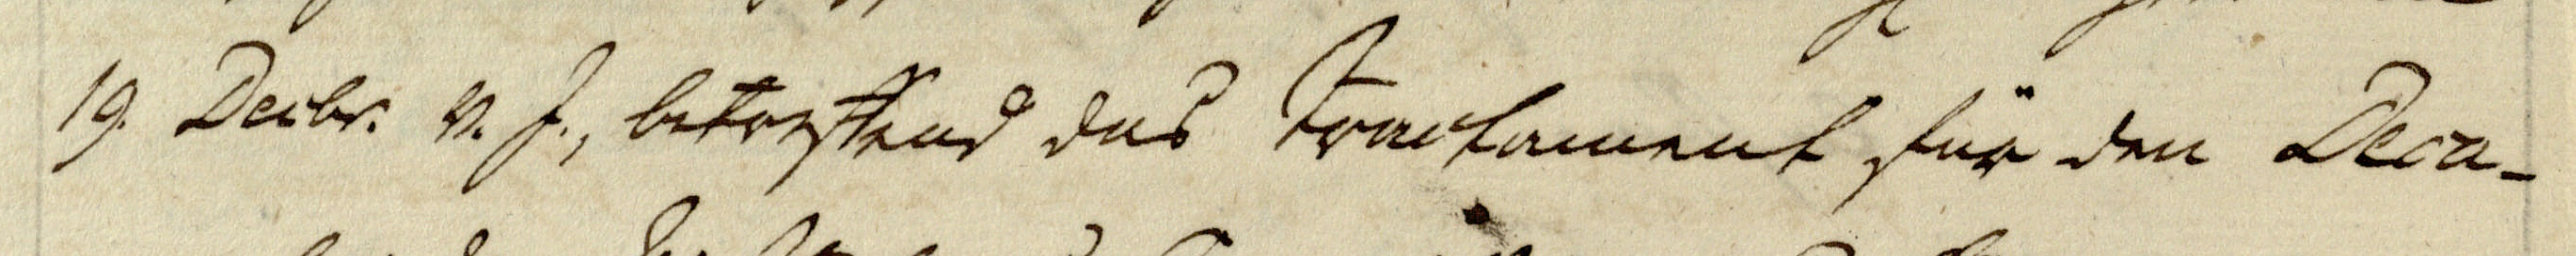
19. Decbr. v. J., betreffend das Tractament für den Deca¬
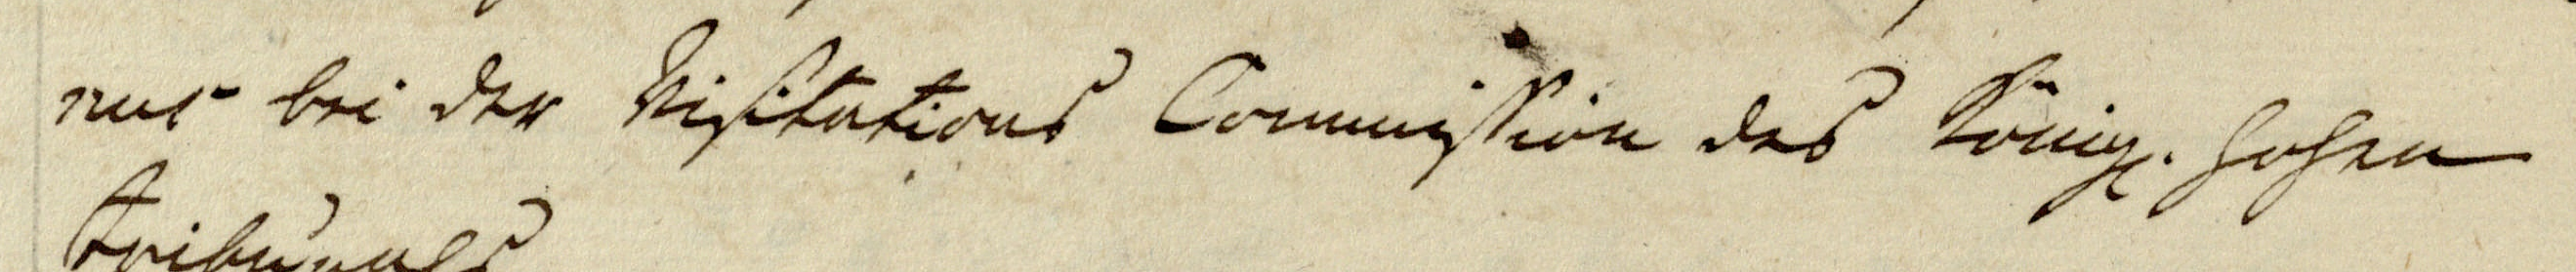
nus bei der Visitations Commission des Königl. Hohen
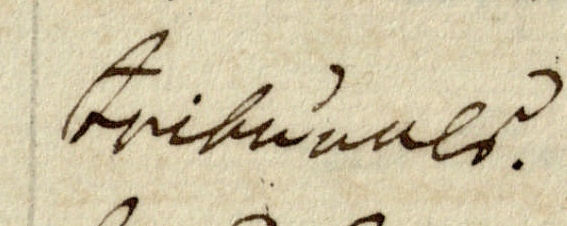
Tribunals.
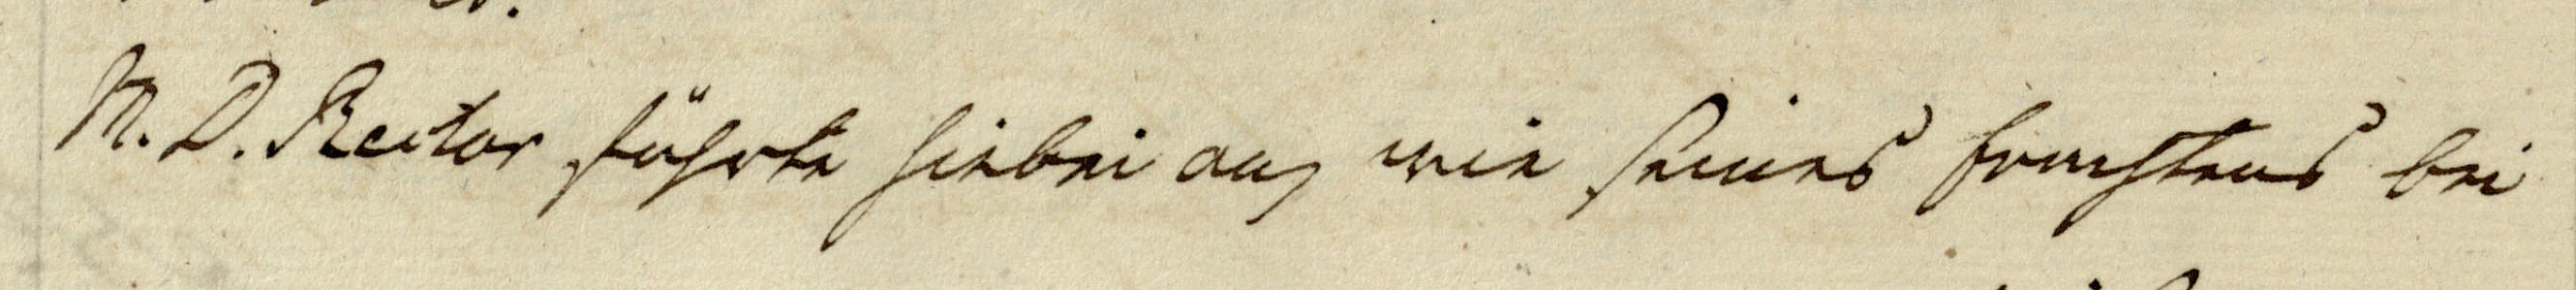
M. D Rector führte hiebei an, wie seines Erachtens bei
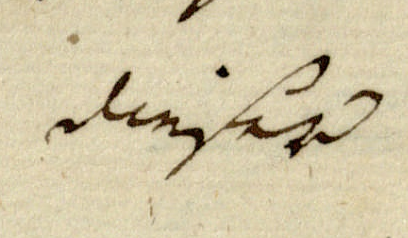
dieser
